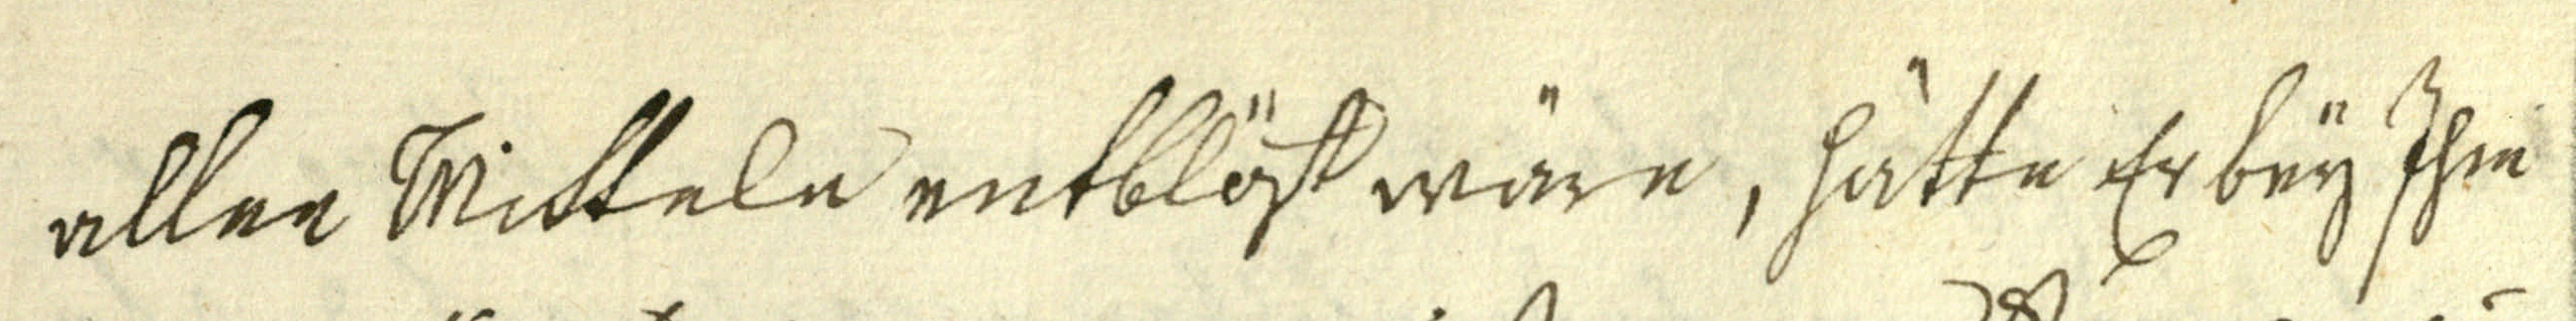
allen Mitteln entblöst wäre, hätte Er beÿ Ihm
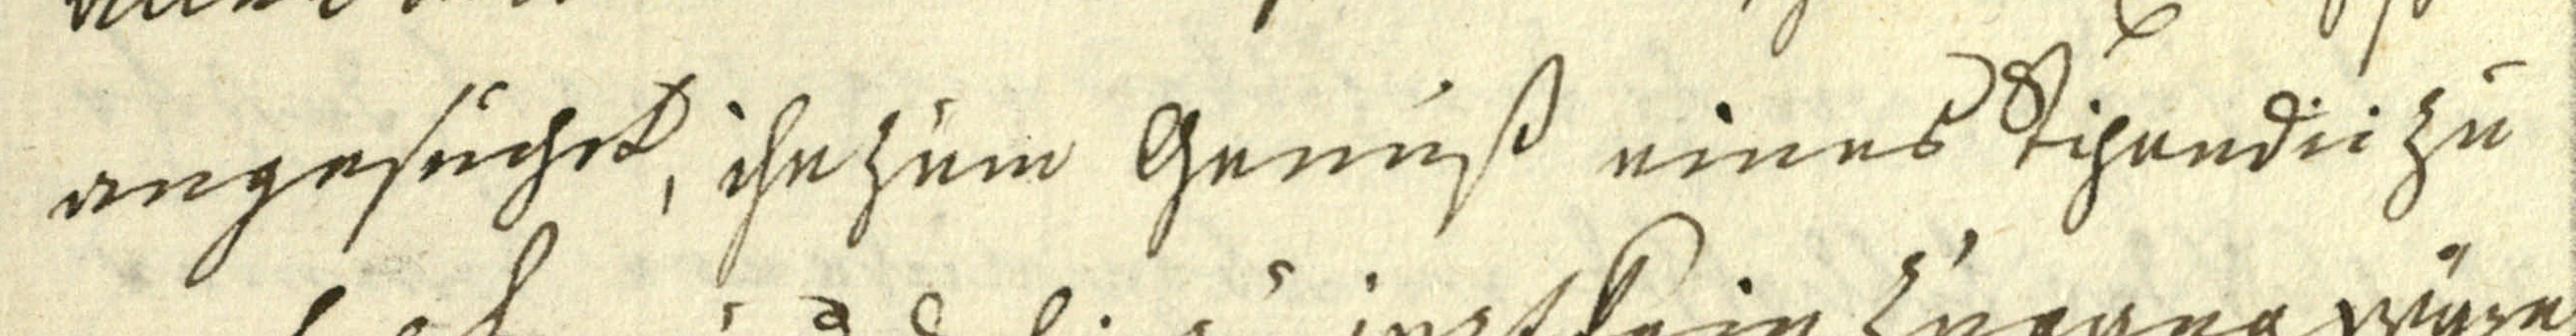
angesuchet, ihn zum Genuß eines Stipendii zu
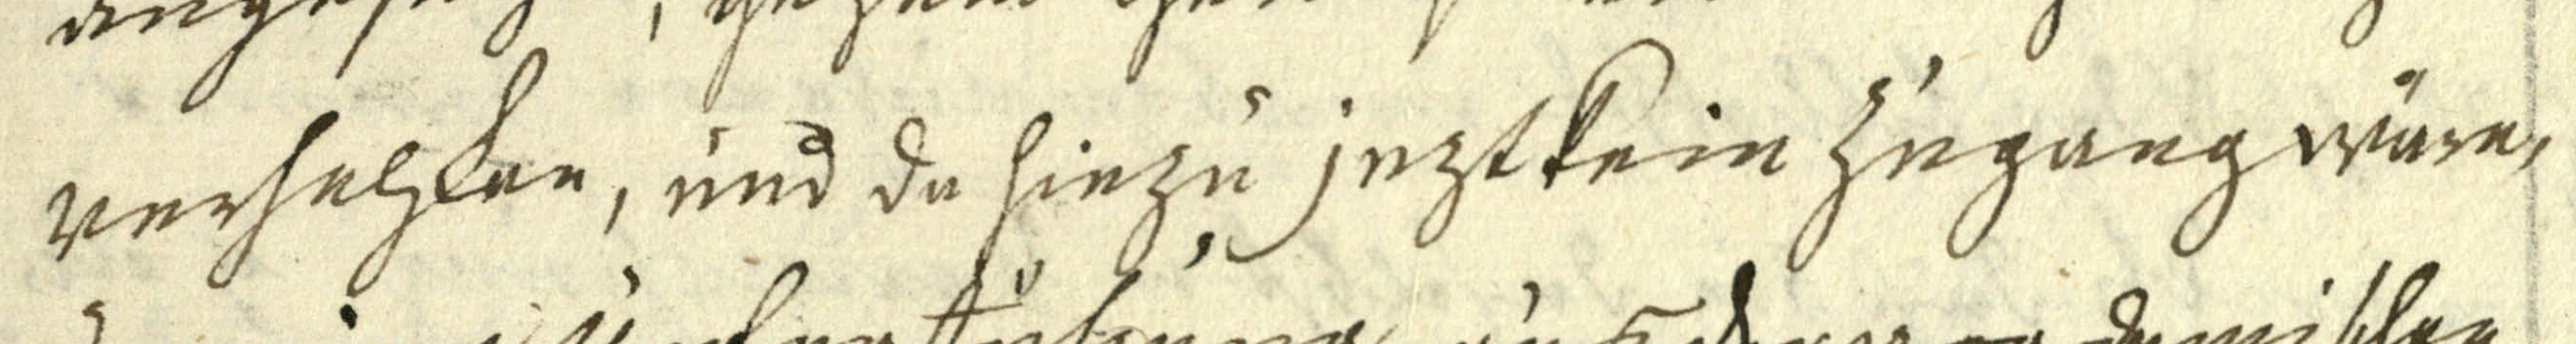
verhelfen, und da hiezu jezt kein Zugang wäre,
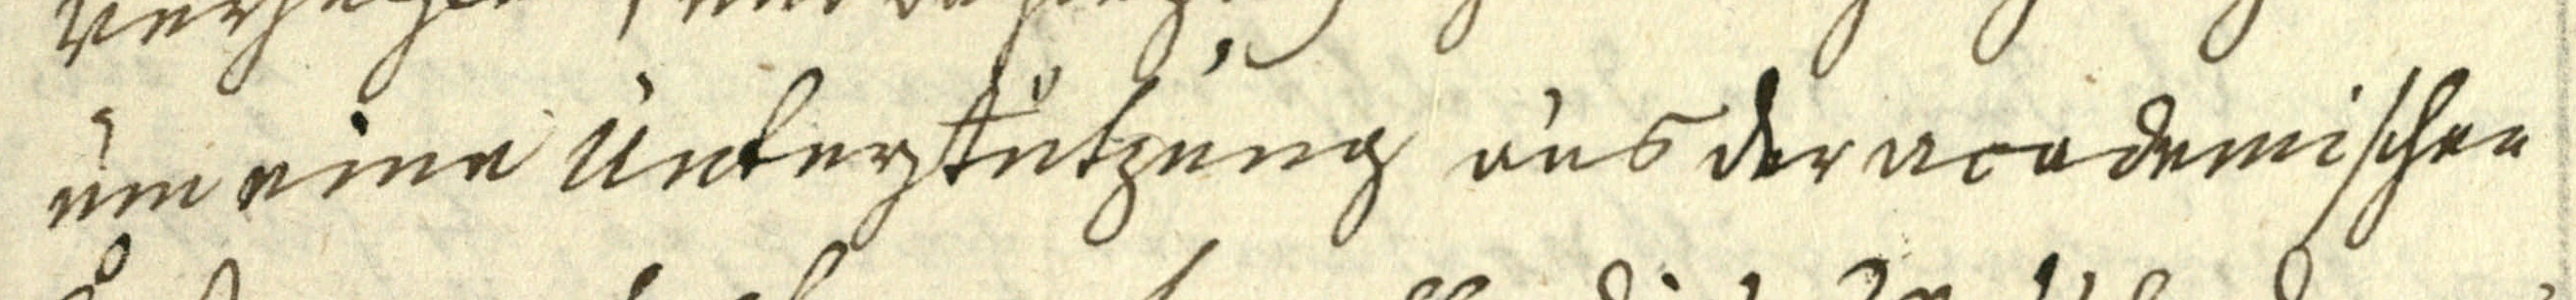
um eine Unterstützung aus der academischen
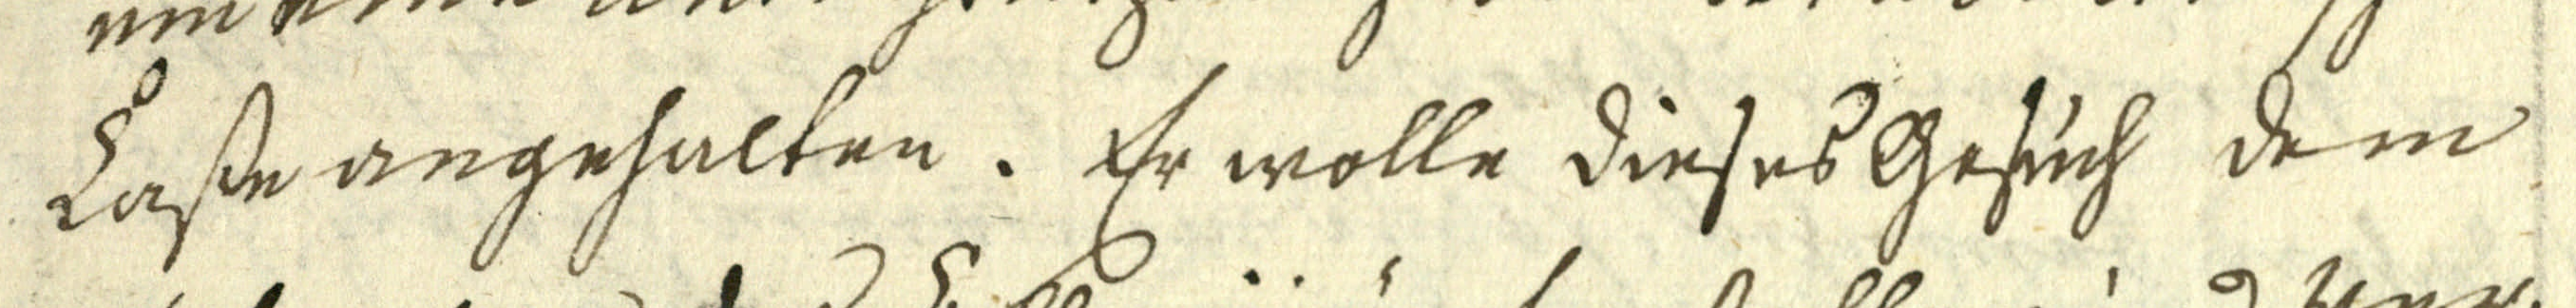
Caße angehalten. Er wolle dieses Gesuch dem
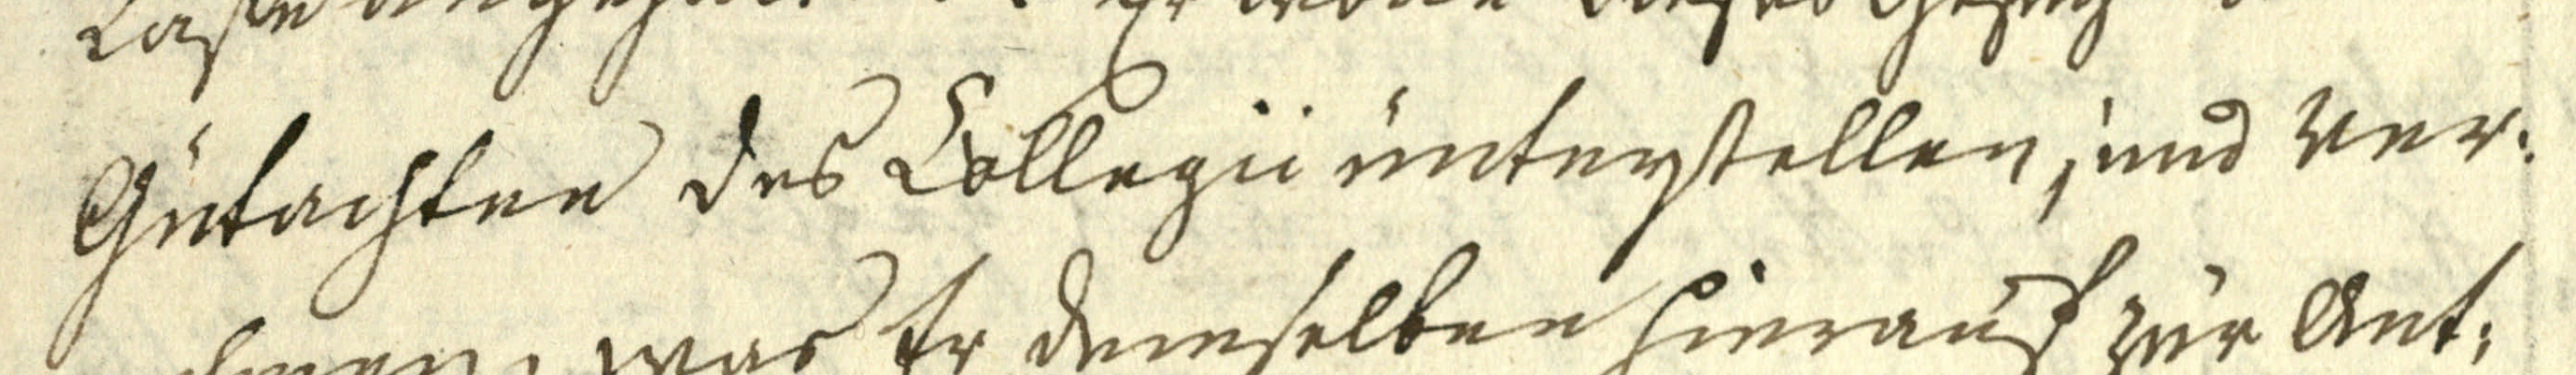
Gutachten des Collegii unterstellen, und ver¬
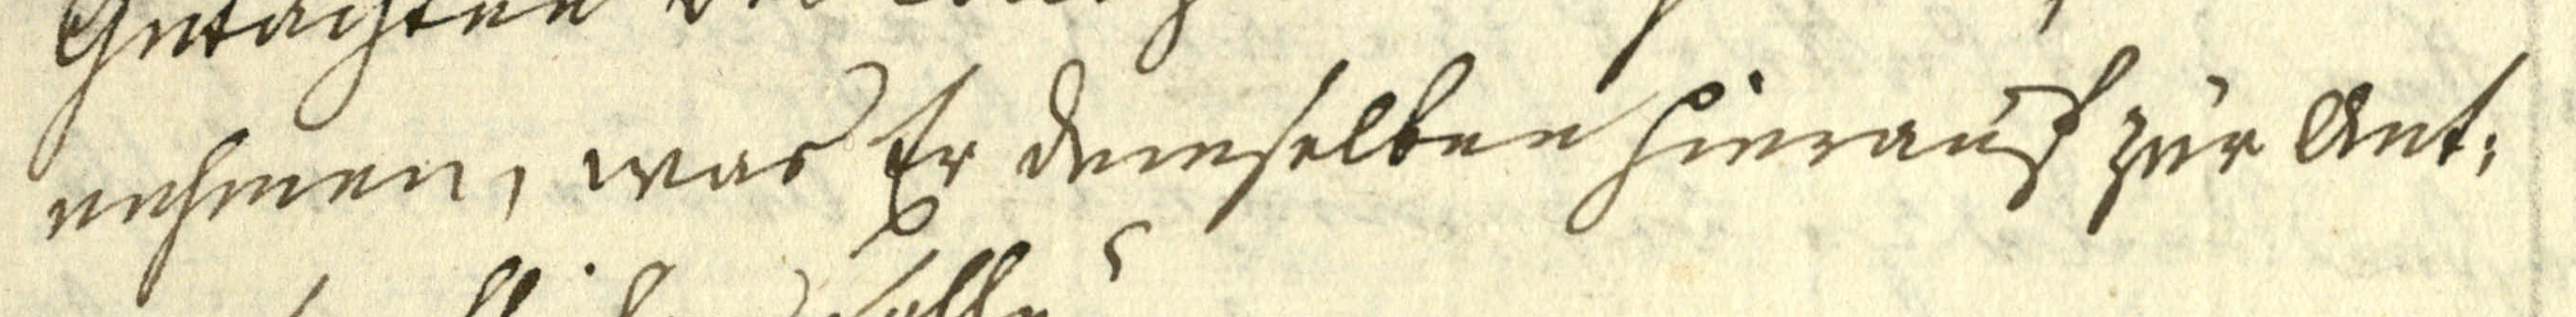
nehmen, was Er demselben hierauf zur Ant¬
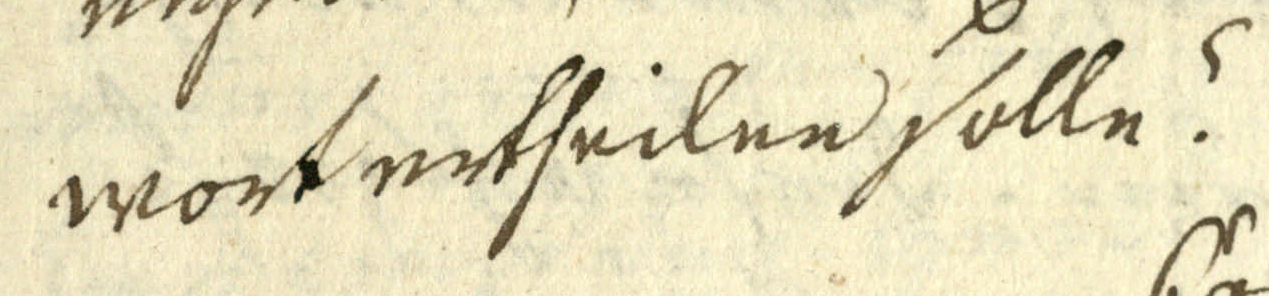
wort ertheilen solle?
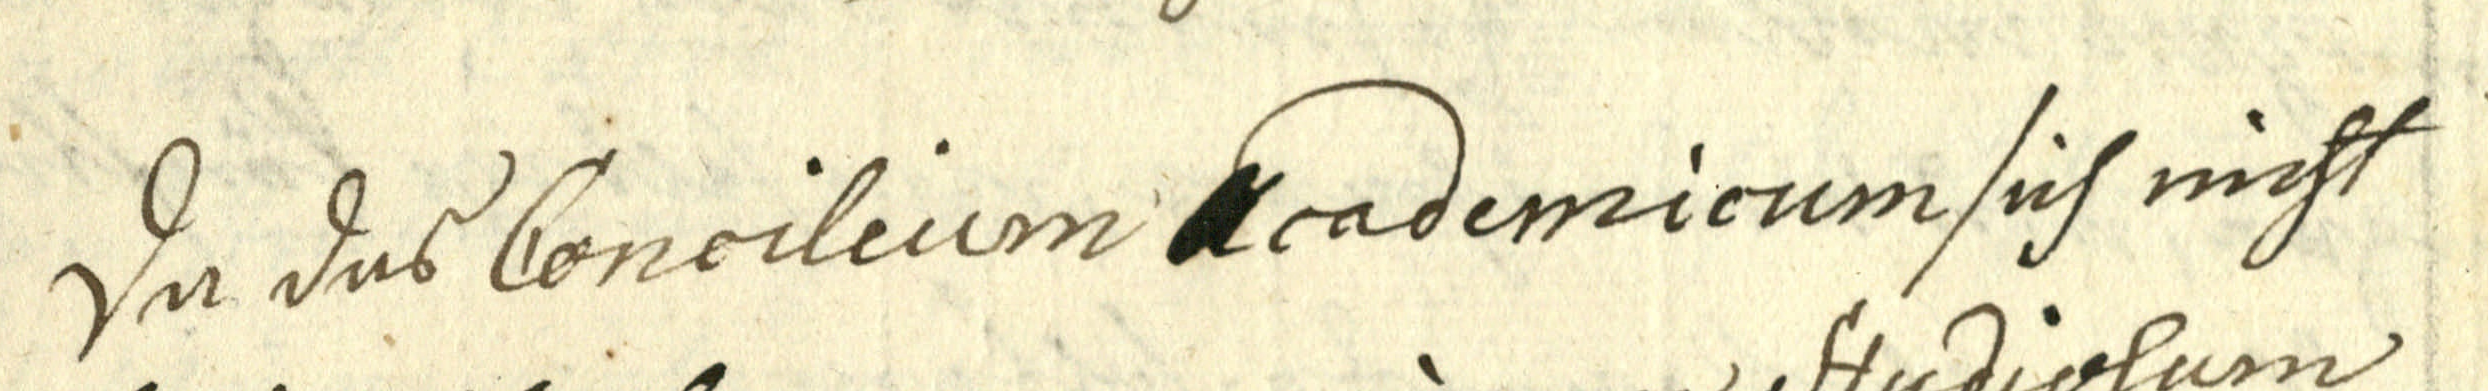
Da das Concilium Academicum sich nicht
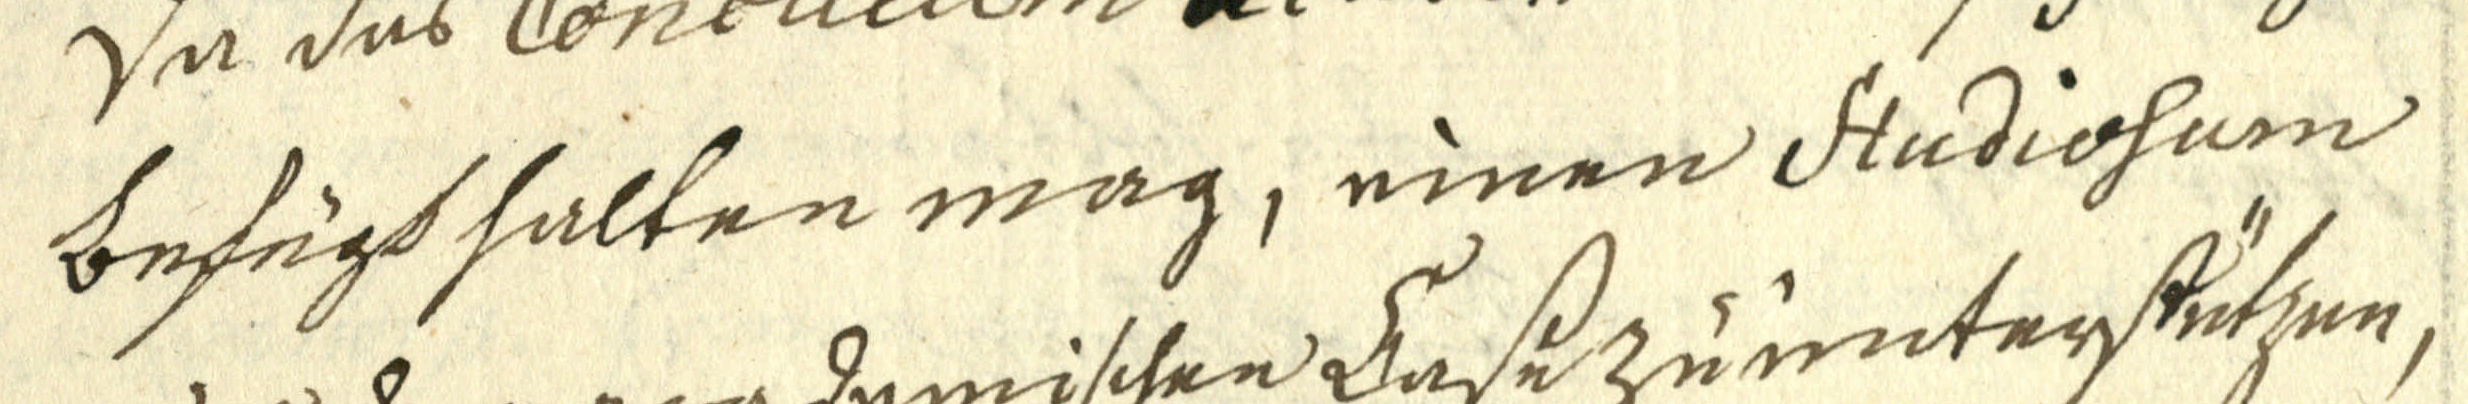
befugt halten mag, einen Studiosum
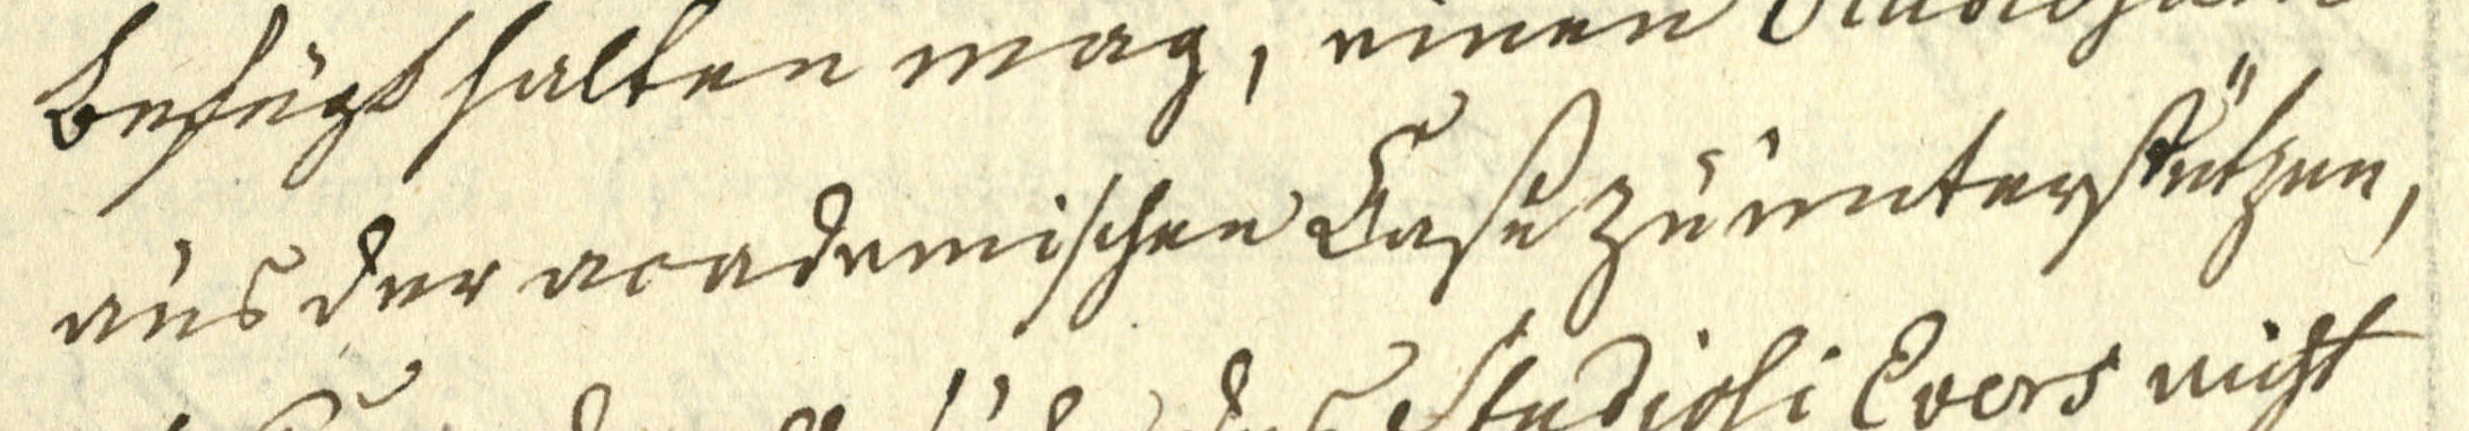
aus der academischen Caße zu unterstützen,
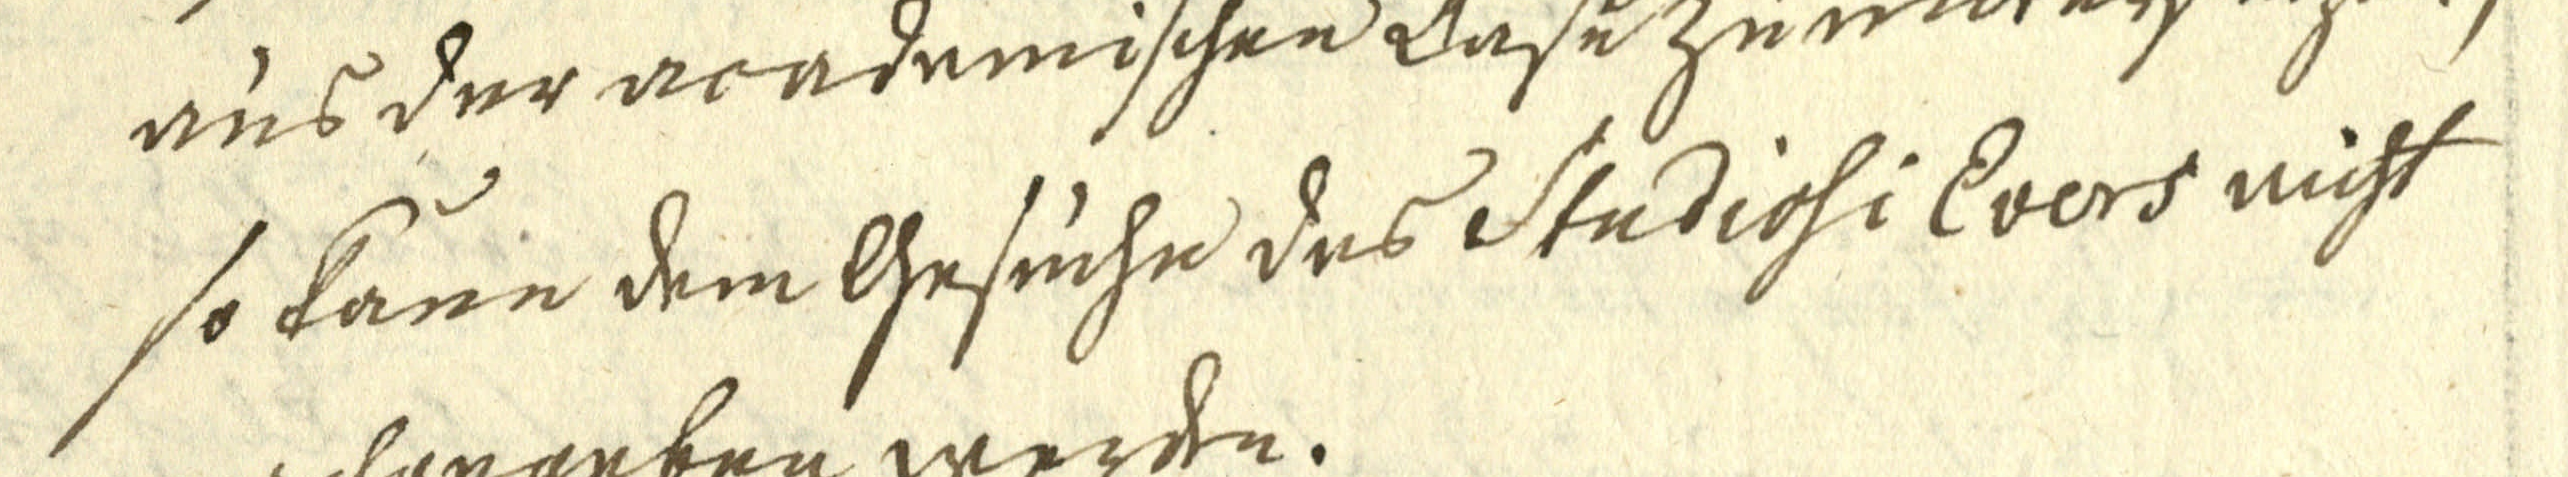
so kann dem Gesuche des Studiosi Evers nicht
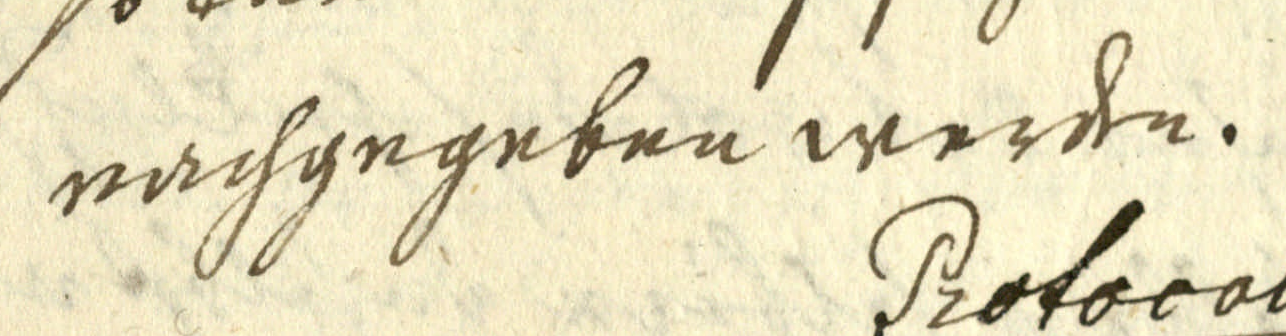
nachgegeben werden.
